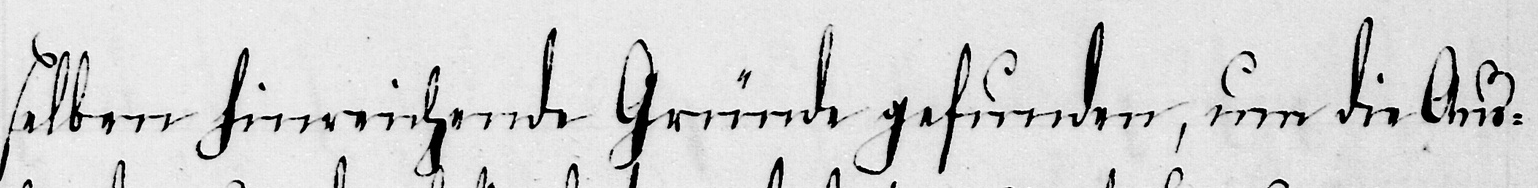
selben hinreichende Gründe gefunden, um die Aus¬
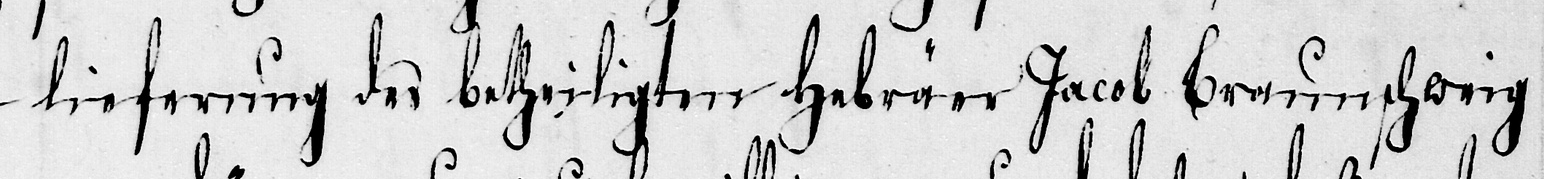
lieferung des betheiligten Hebräer Jacob Braunschweig
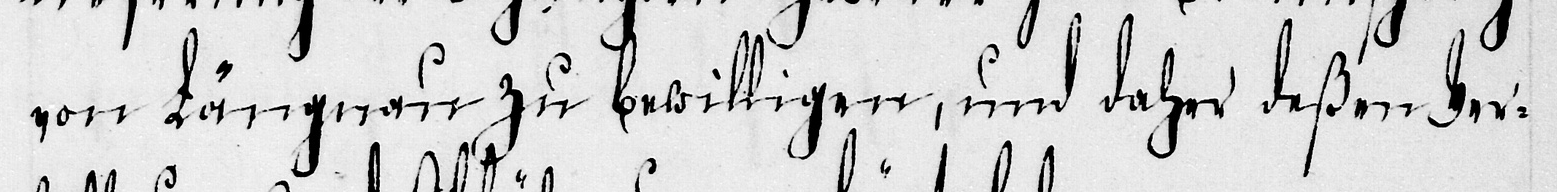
von Längnau [sic!] zu bewilligen, und daher deßen Ver¬
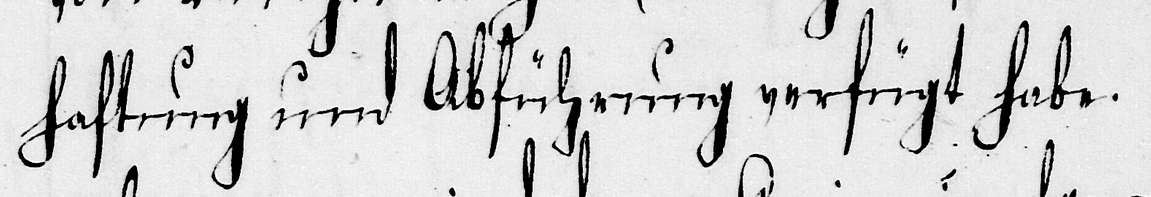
haftung und Abführung verfügt habe.
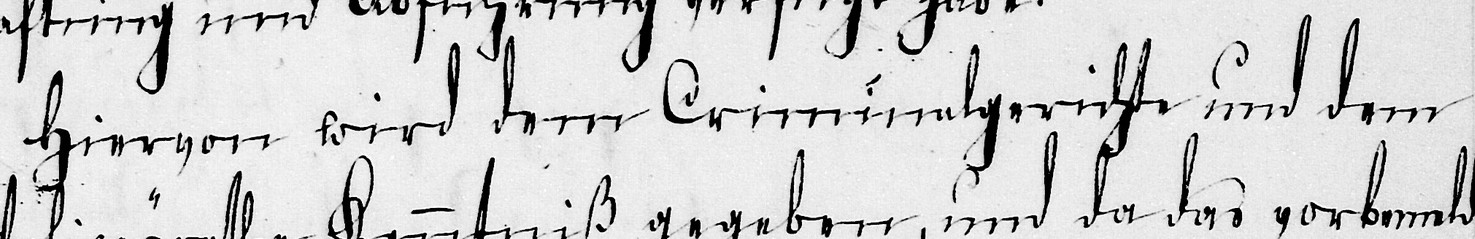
Hiervon wird dem Criminalgerichte und dem
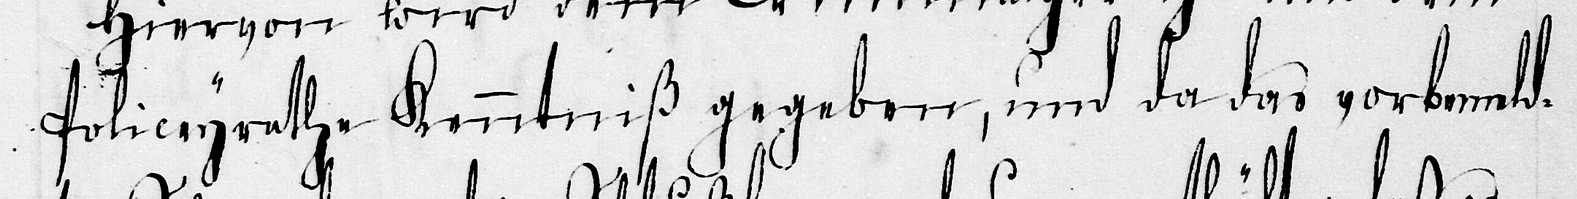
Policeyrathe Kenntniß gegeben, und da das vorbemeld¬
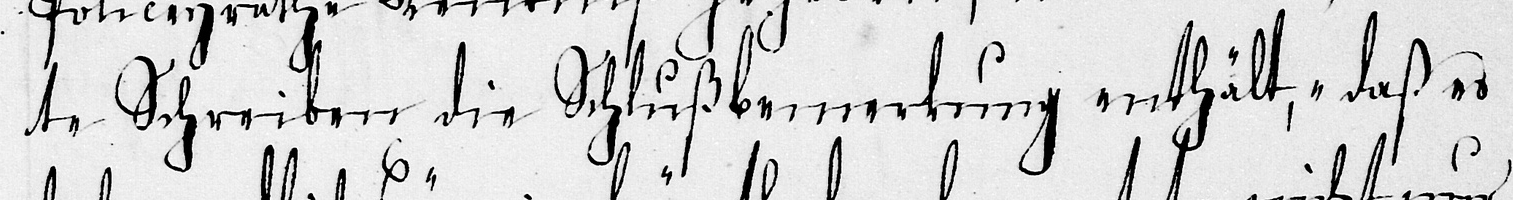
te Schreiben die Schlußbemerkung enthält, „daß es
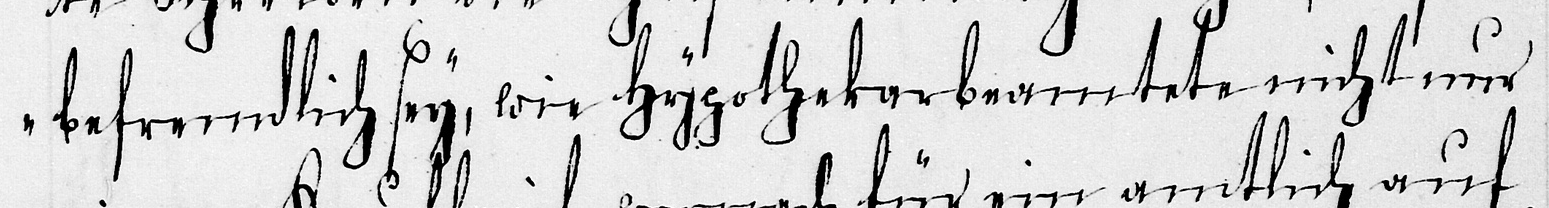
befremdlich sey, wie Hypothekarbeamtete nicht nur
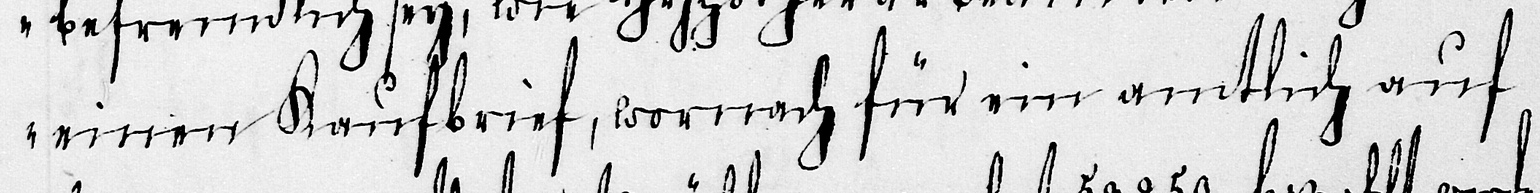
einen Kaufbrief, wornach für ein amtlich auf
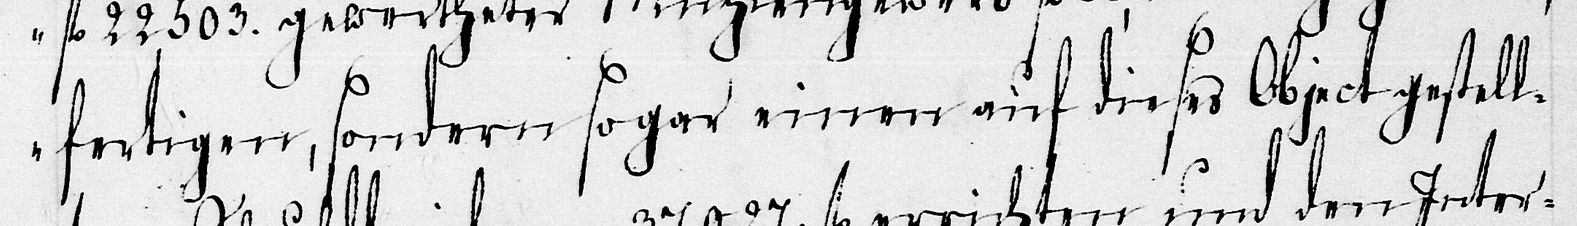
fertigen, sondern sogar einen auf dieses Object gestel¬
